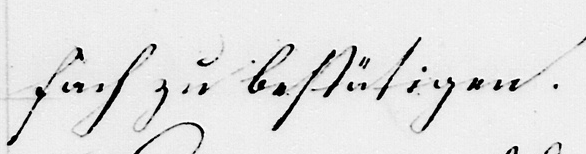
fach zu bestätigen.
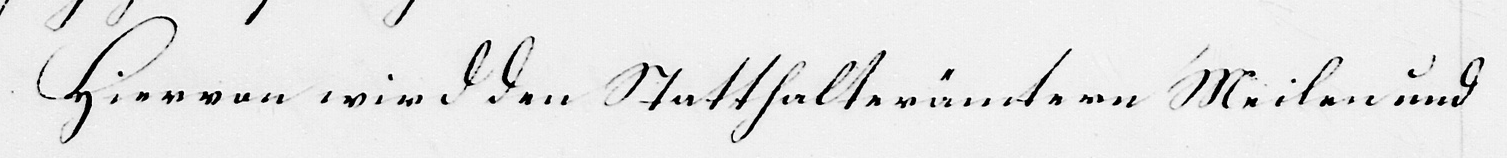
Hiervon wird den Statthalterämtern Meilen und
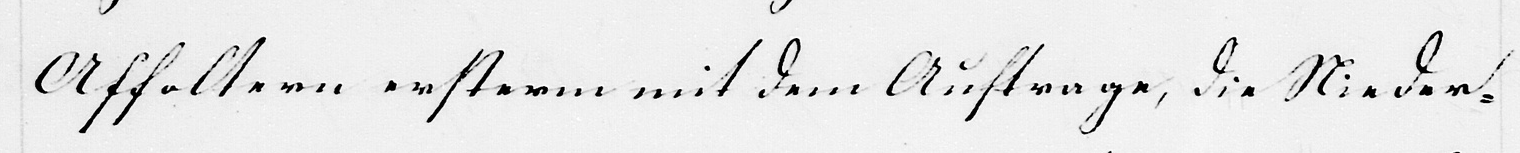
Affoltern ersterm mit dem Auftrage, die Nieder¬
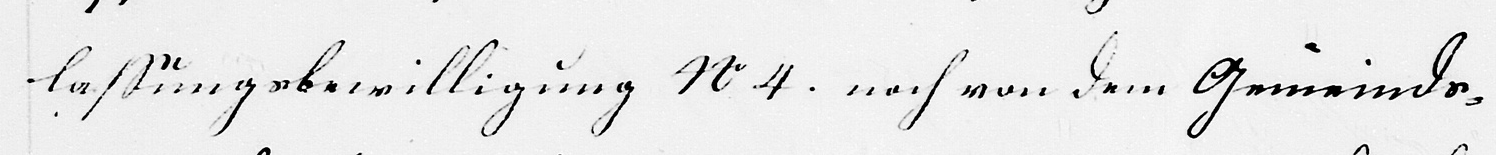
laßungsbewilligung No. 4. noch von dem Gemeinds¬
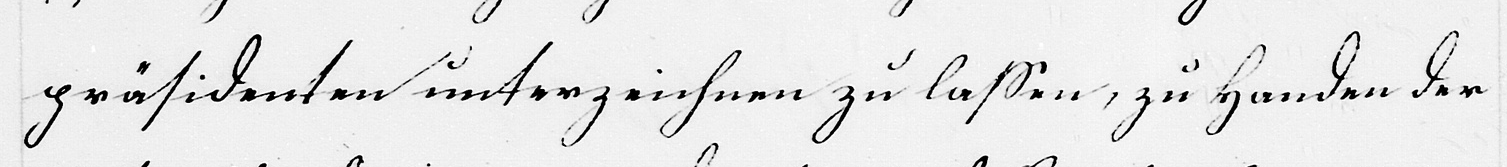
präsidenten unterzeichnen zu laßen, zu Handen der
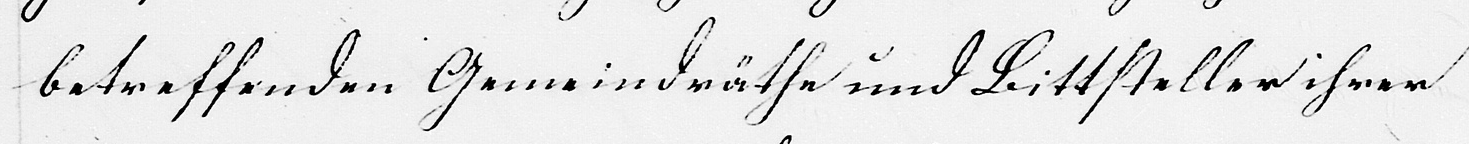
betreffenden Gemeindräthe und Bittsteller ihrer
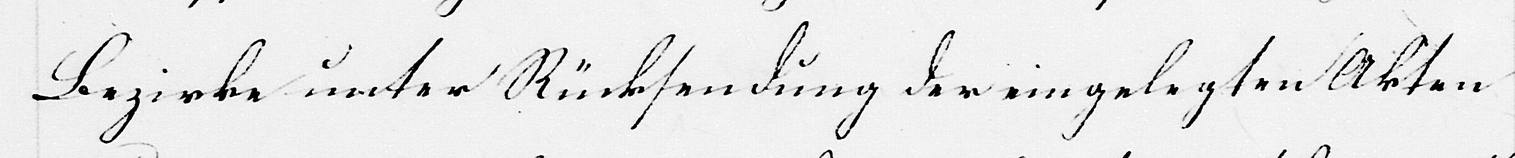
Bezirke unter Rücksendung der eingelegten Akten
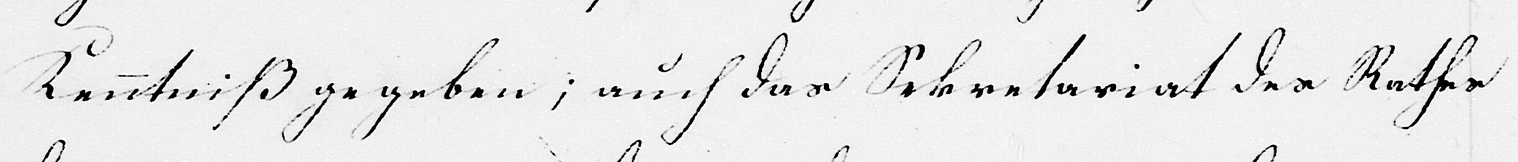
Kenntniß gegeben; auch das Sekretariat des Rathes
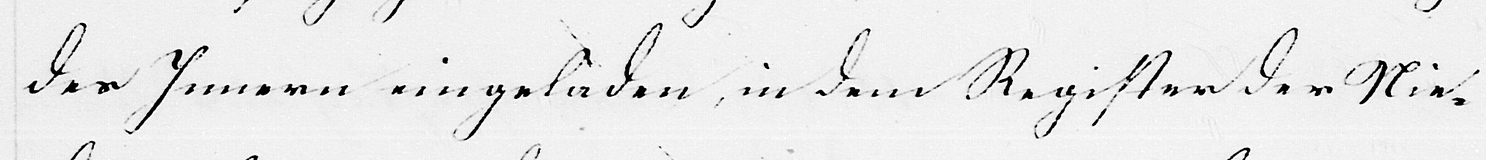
des Innern eingeladen, in dem Register der Nie¬
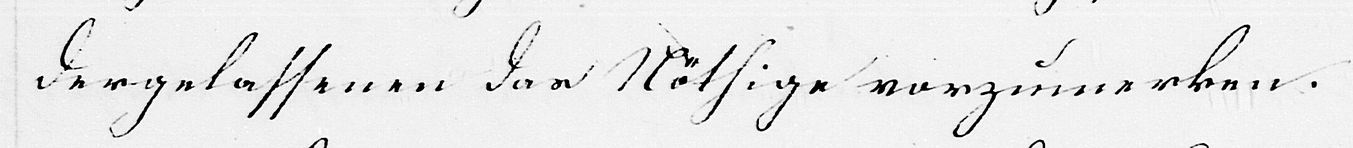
dergelassenen das Nöthige vorzumerken.
